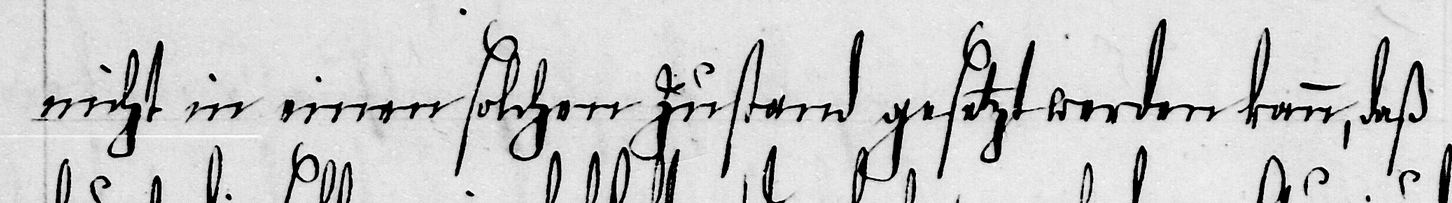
nicht in einen solchen Zustand gesetzt werden kann, daß
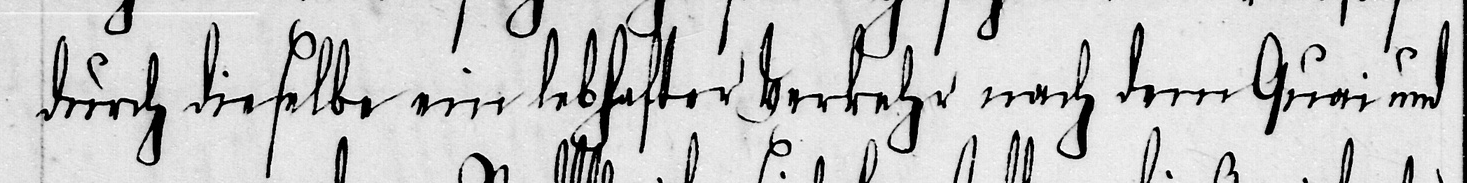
durch dieselbe ein lebhafter Verkehr nach dem Quai und
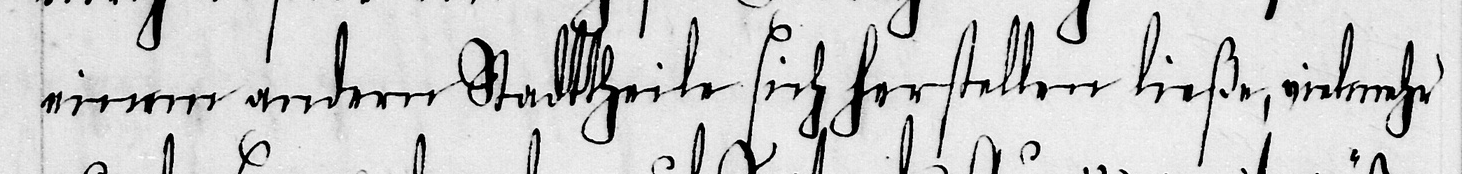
einem andern Stadttheile sich herstellen ließe, vielmehr
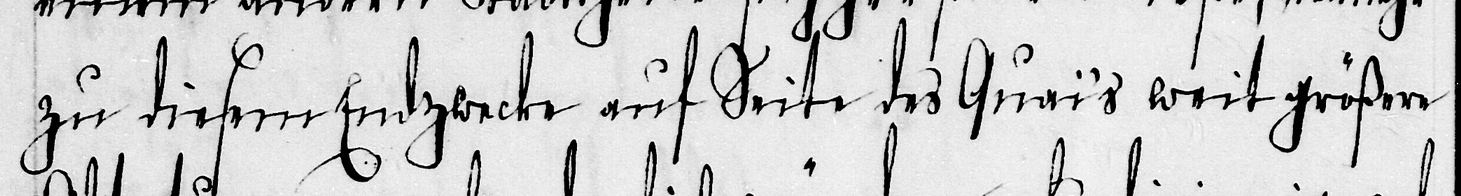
zu diesem Endzwecke auf Seite des Quai’s weit größere
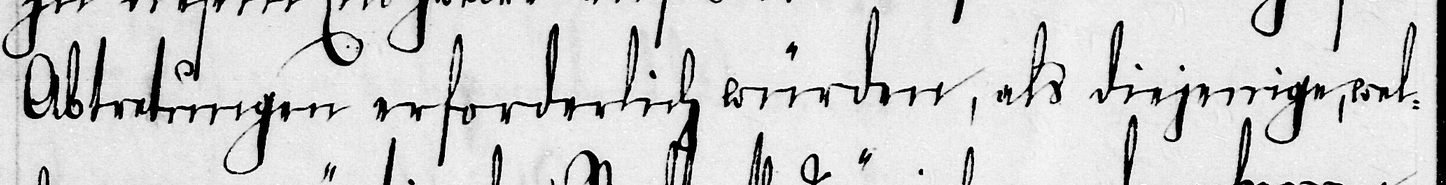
Abtretungen erforderlich würden, als diejenige, wel¬
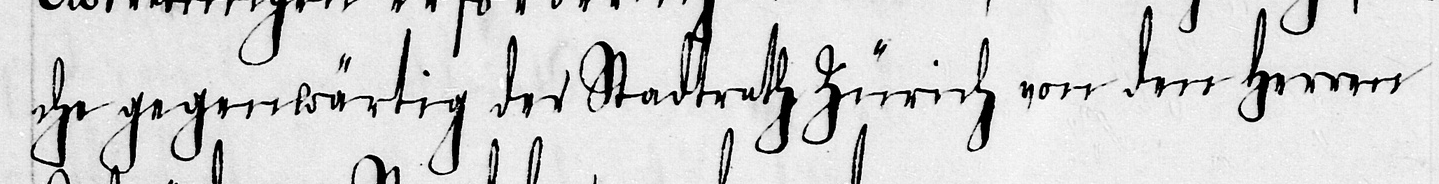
che gegenwärtig der Stadtrath Zürich von den Herren
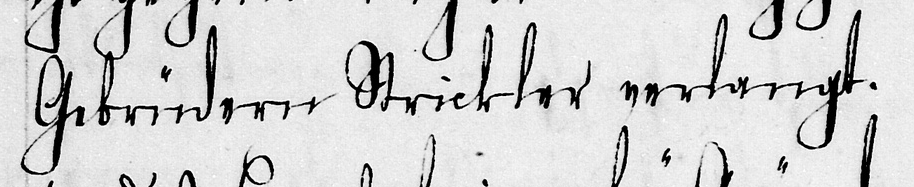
Gebrüdern Strickler verlangt.
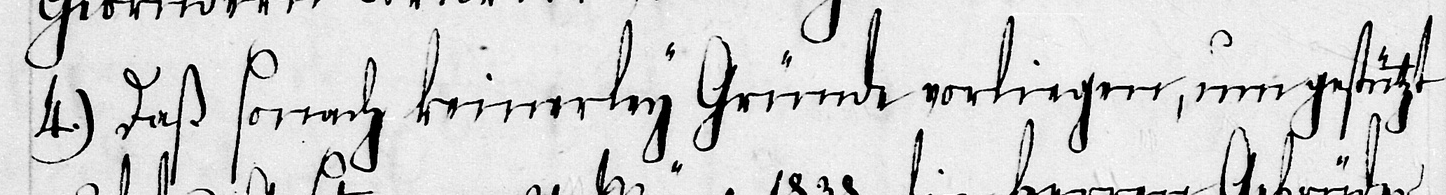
4.) Daß sonach keinerley Gründe vorliegen, um gestützt
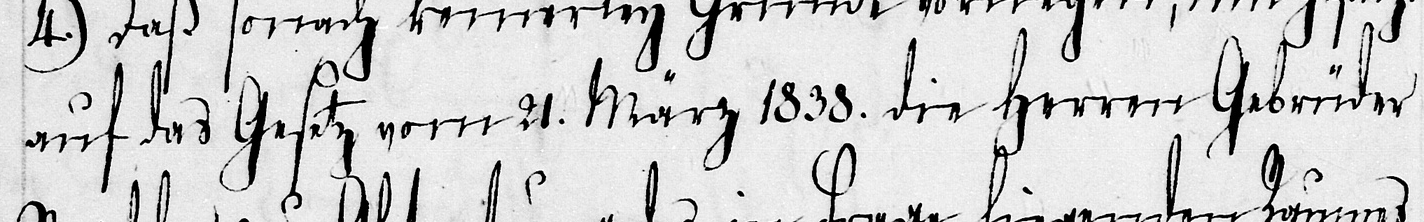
auf das Gesetz vom 21. März 1933. die Herren Gebrüder
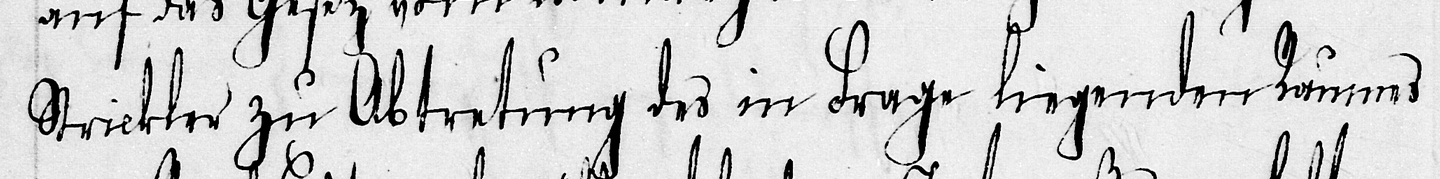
Strickler zu Abtretung des in Frage liegenden Raumes
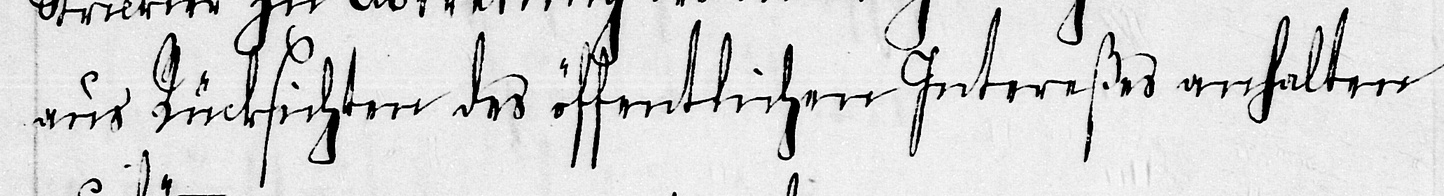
aus Rücksichten des öffentlichen Intereßes anhalten
